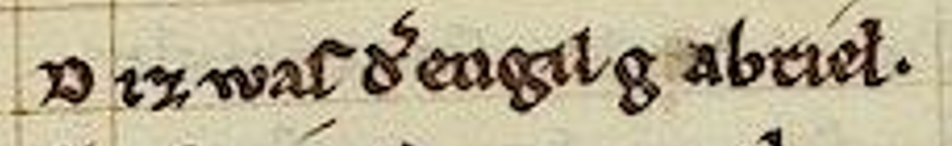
Diz waſ d(er) engil g abriel.
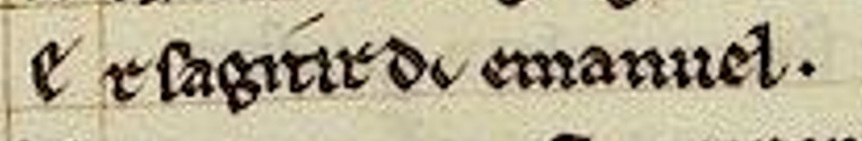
Er ſagitir d(az) emanuel.
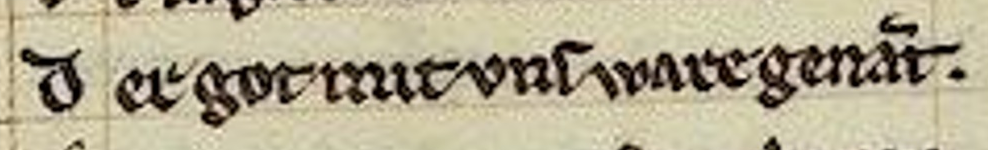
Der got mit vnſ ware gena(n)t.
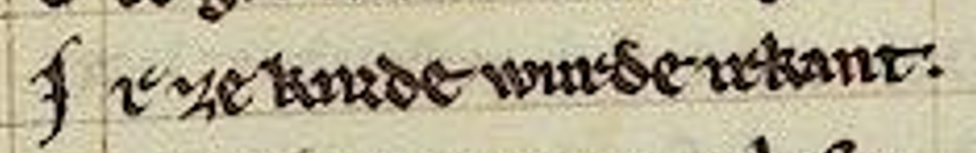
Ir ze kinde wurde irkant.
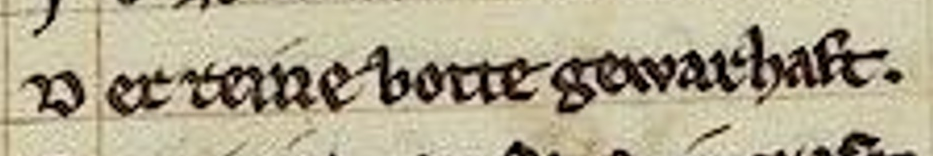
Der reine botte gewarhaft.
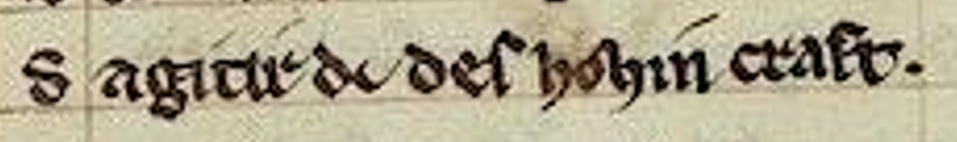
Sagitir d(az) deſ hohin craft.
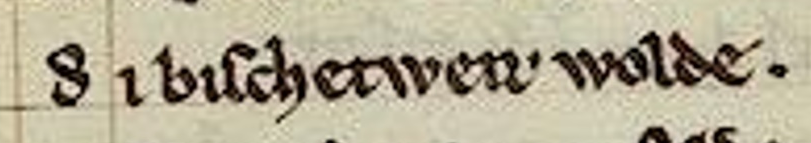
Si biſchetwen wolde.
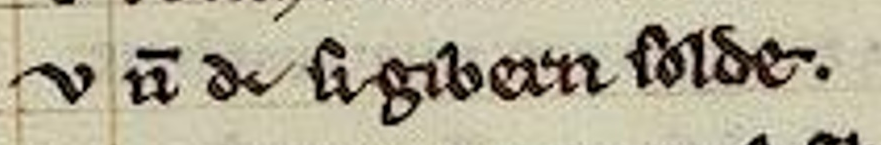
Vn(d) d(az) ſi gibern ſolde.
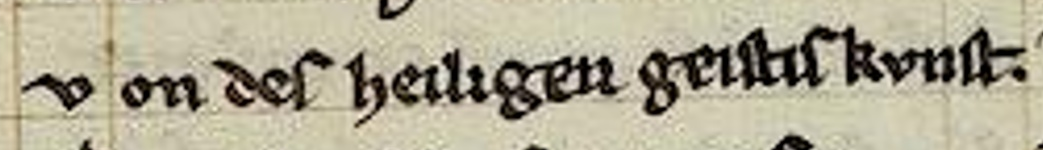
Von deſ heiligen geiſtiſ kvnſt.
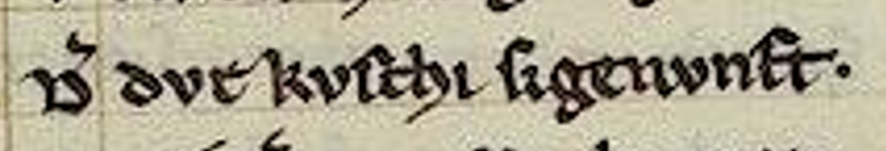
D(er) dvr kvſchi ſigenvnft.
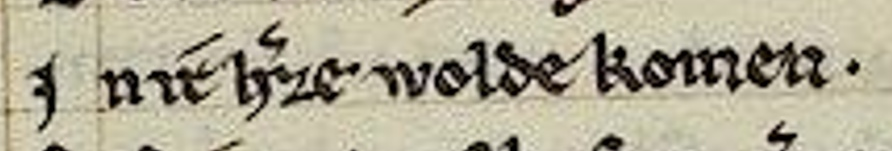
In ir h(er)ze wolde komen.
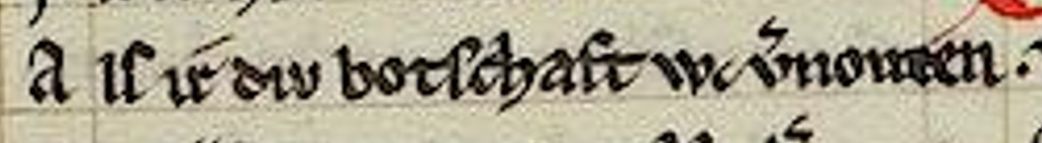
Alſ ir div botſchaft w(az) v(er)nomen.
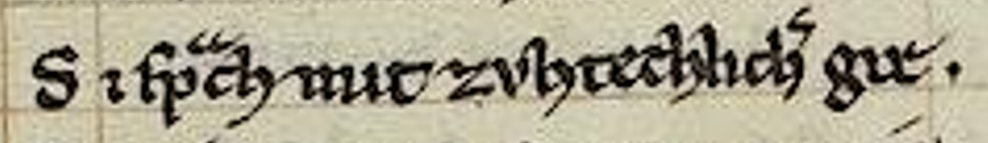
Si ſp(ra)ch mit zvhtechlich(er) gir.
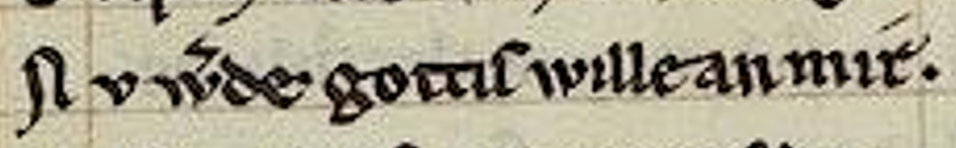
Nv w(er)de gottiſ wille an mir.
